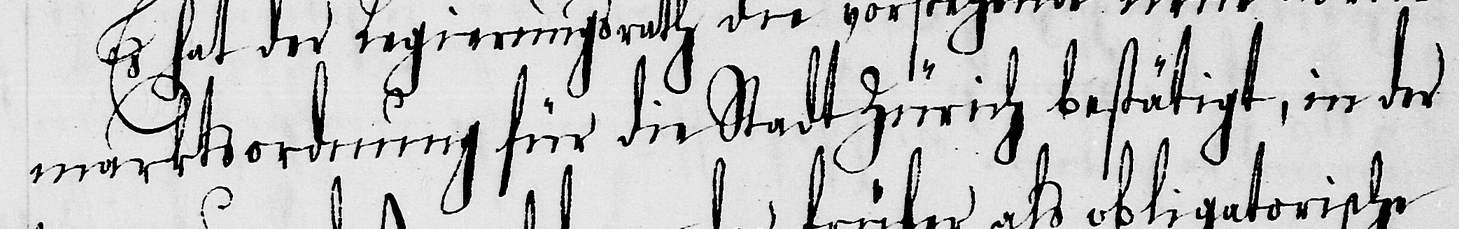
marktsordnung für die Stadt Zürich bestätigt, in der
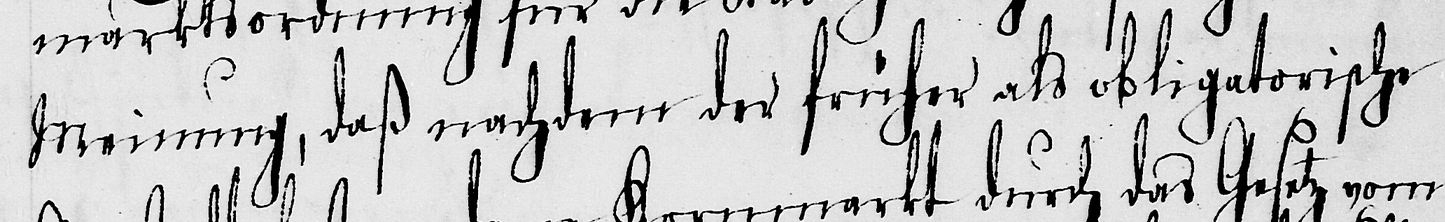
Meinung, daß nachdem der früher als obligatorische
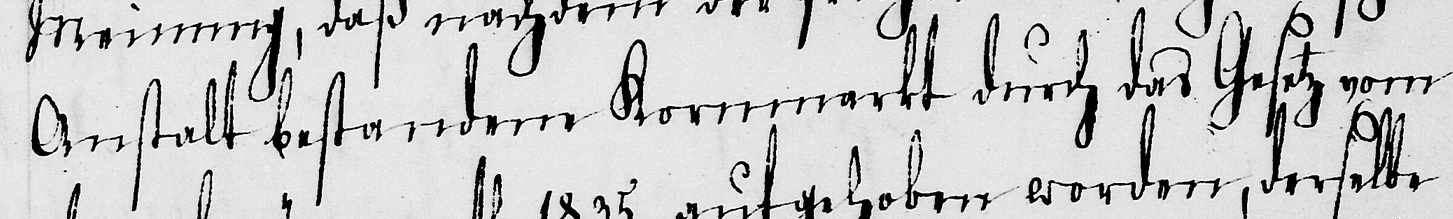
Anstalt bestandene Kornmarkt durch das Gesetz vom
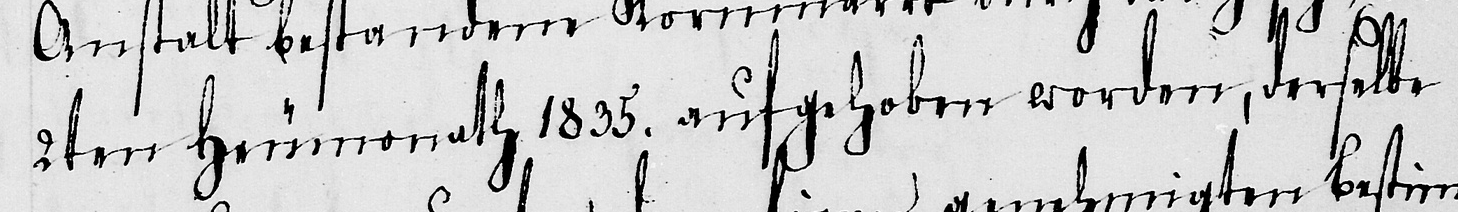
2ten Heumonath 1835. aufgehoben worden, derselbe
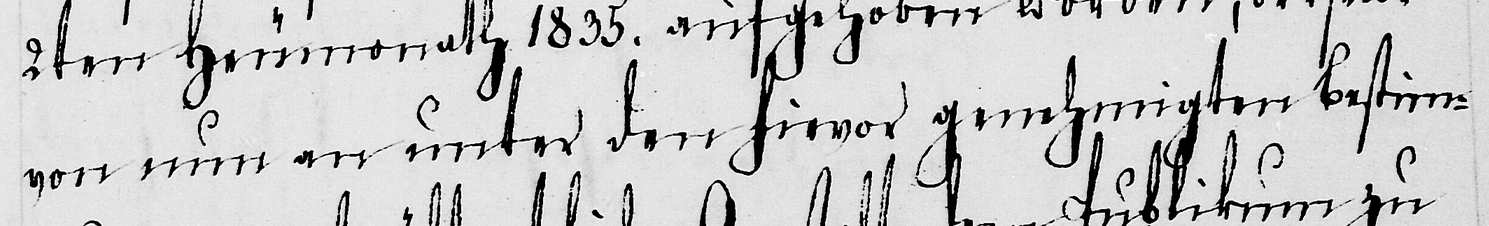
von nun an unter den hievor genehmigten Bestimm¬
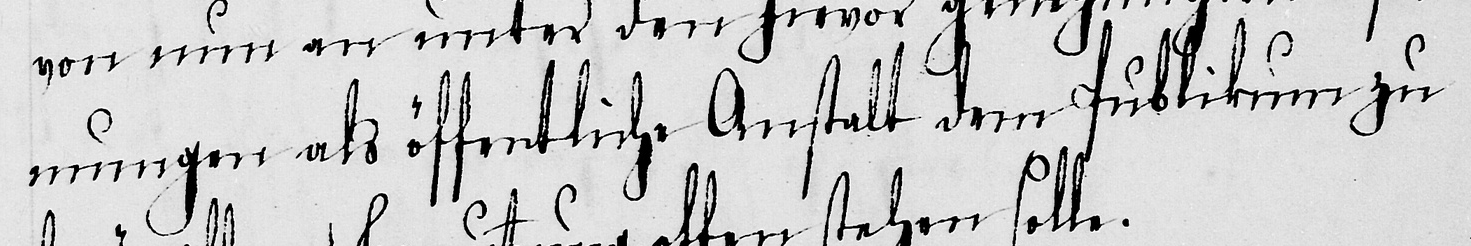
ungen als öffentliche Anstalt dem Publikum zu
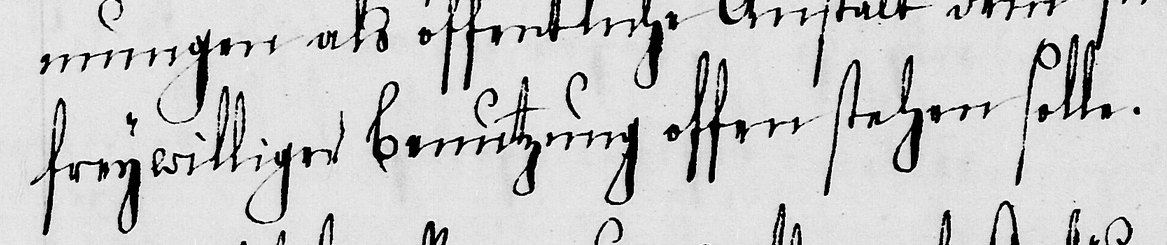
freywilliger Benutzung offen stehen soll¬
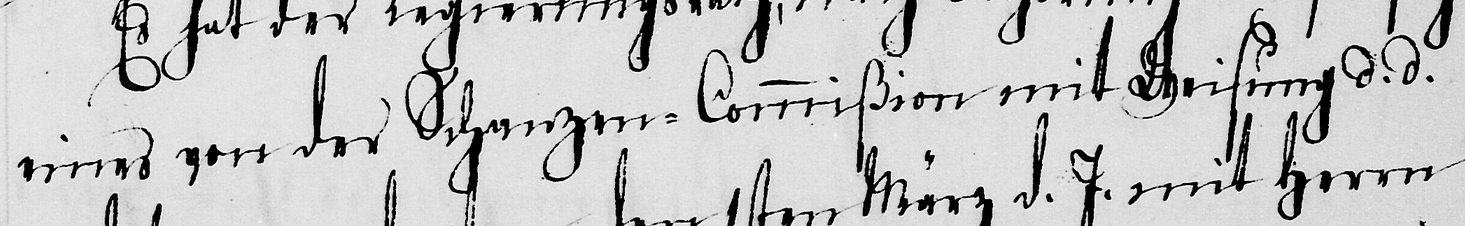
eines von der Schanzen-Commißion mit Weisung d. d.
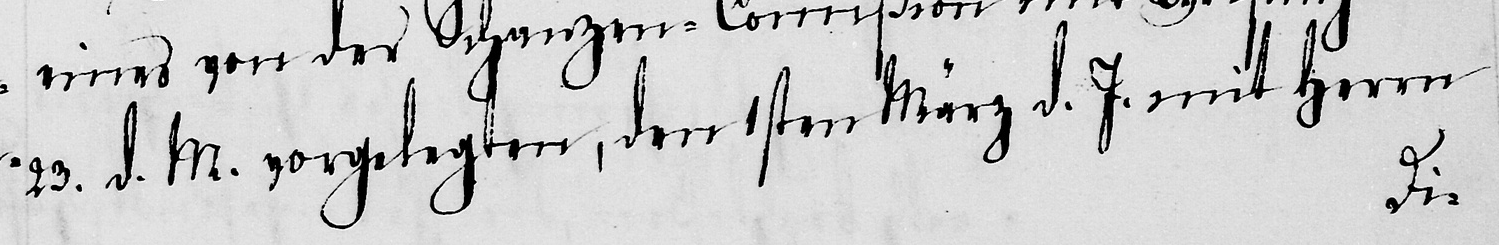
23. d. M. vorgelegten, den 1sten März d. J. mit Herrn
